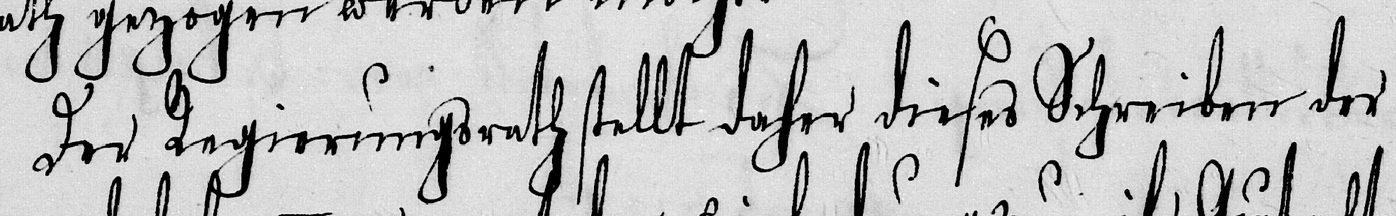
Der Regierungsrath stellt daher dieses Schreiben der
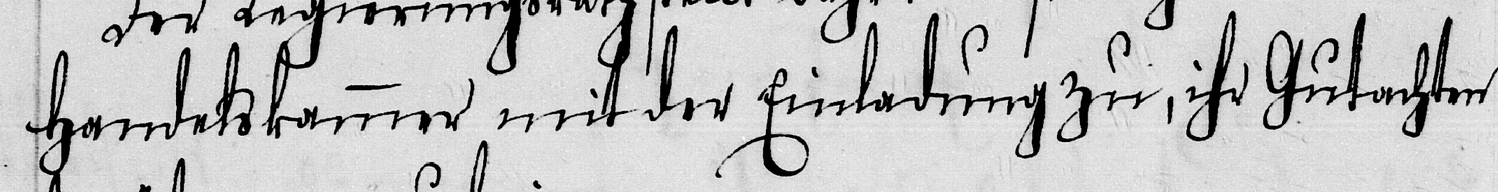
Handelskammer mit der Einladung zu, ihr Gutachten
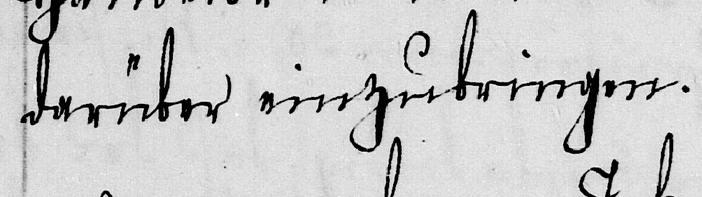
darüber einzubringen.
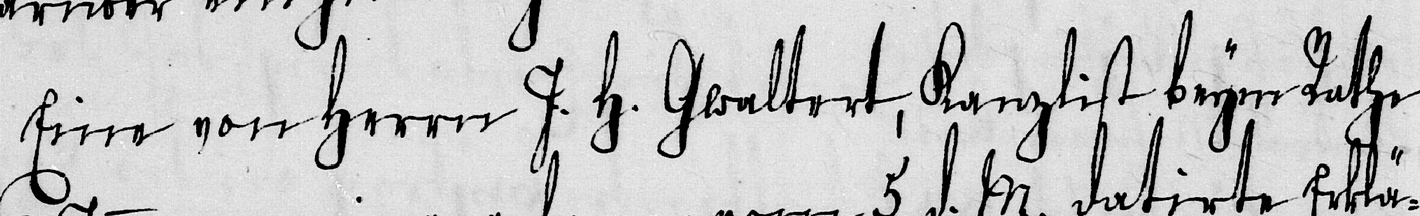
Eine von Herrn J. H. Gwaltert, Kanzlist beym Rathe
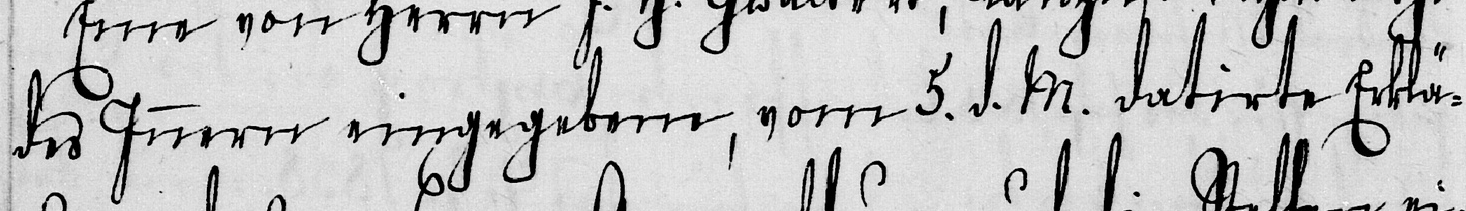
des Innern eingegebene, vom 5. d. M. datirte Erklä¬
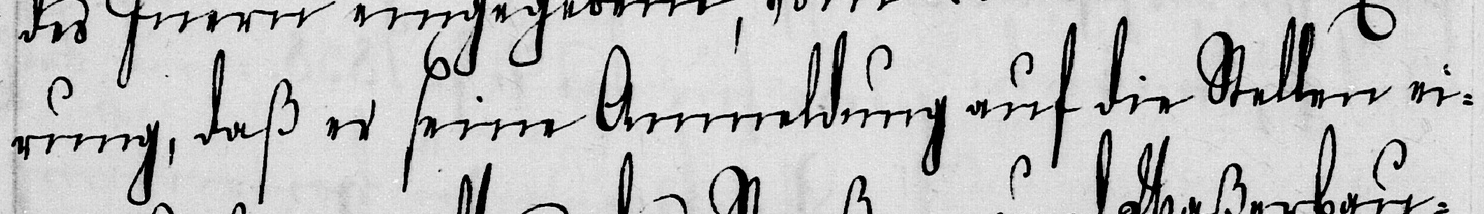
rung, daß er seine Anmeldung auf die Stelle ei¬
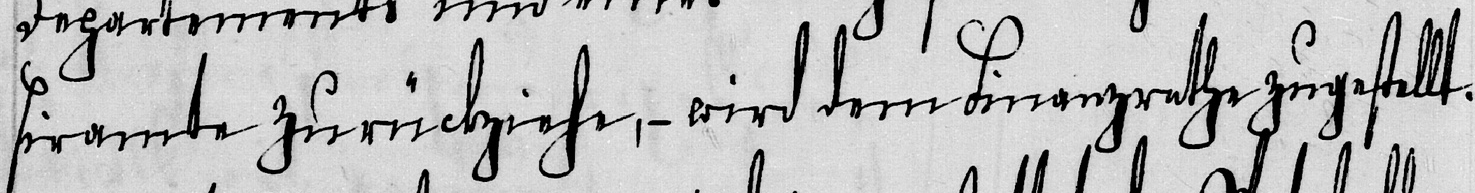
ßiramte zurückziehe, – wird dem Finanzrath zugestel¬
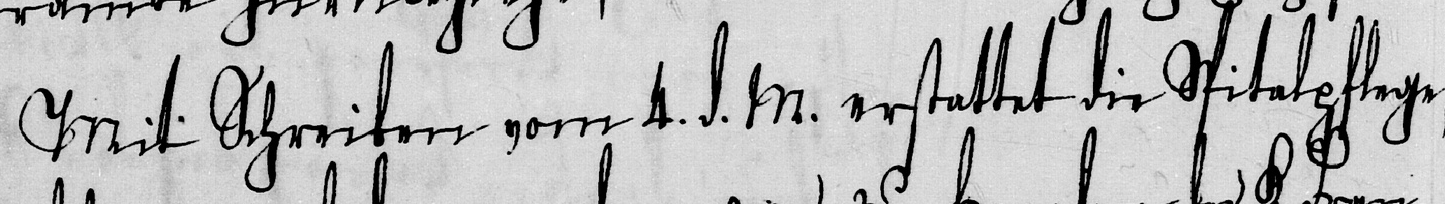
Mit Schreiben vom 4. d. M. erstattet die Spitalpfle¬
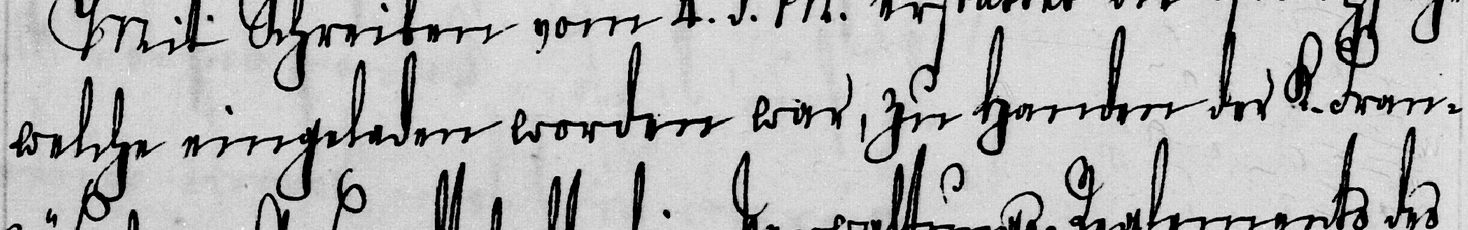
welche eingeladen worden war, zu Handen der K. Franz¬
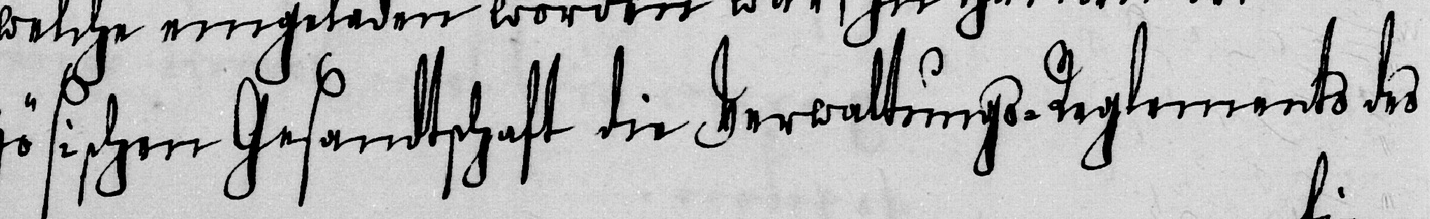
ösischen Gesandtschaft die Verwaltungs-Reglements des
